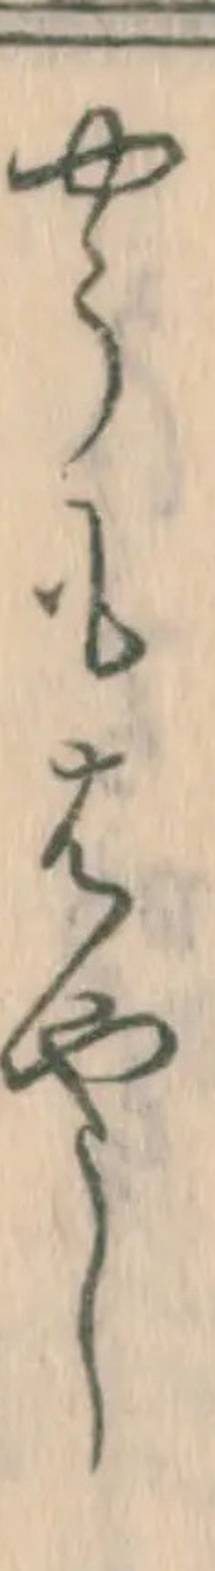やうもはやし
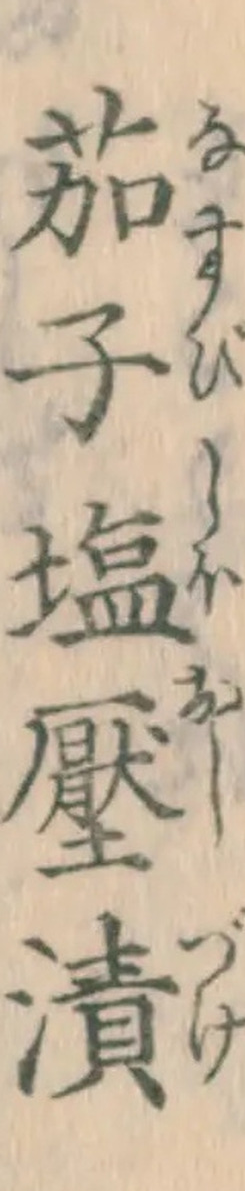茄子塩圧漬
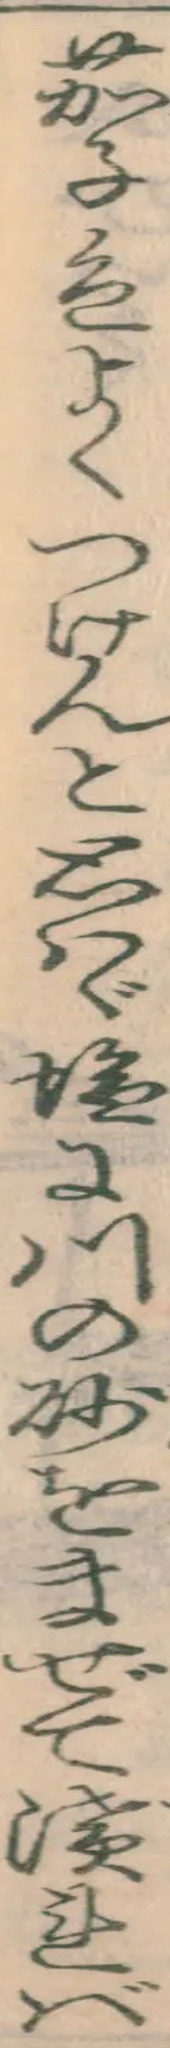茄子色よくつけんと思はゞ塩に川の砂をまぜて漬れば
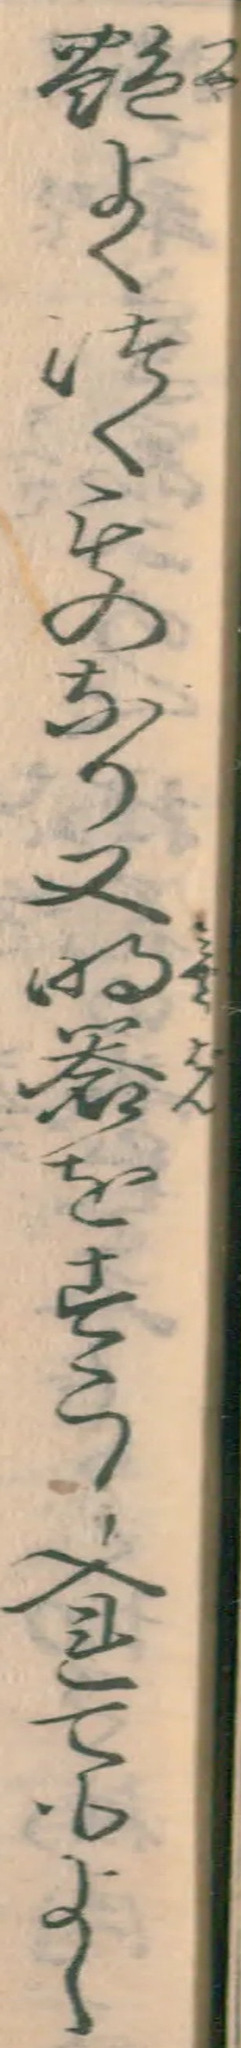艶よくつくものなり又明礬をすこし入れてもよし
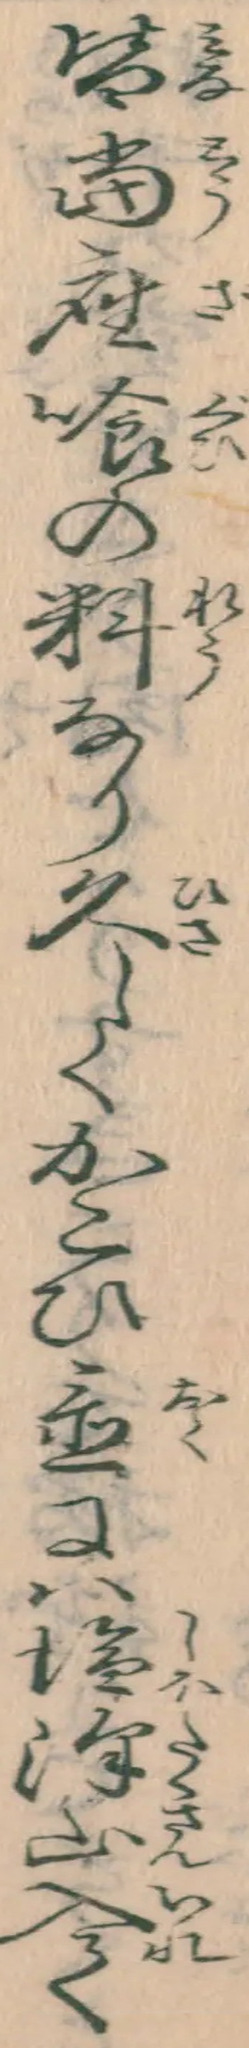皆当座喰の料なり久しくかこひ置には塩沢山入て
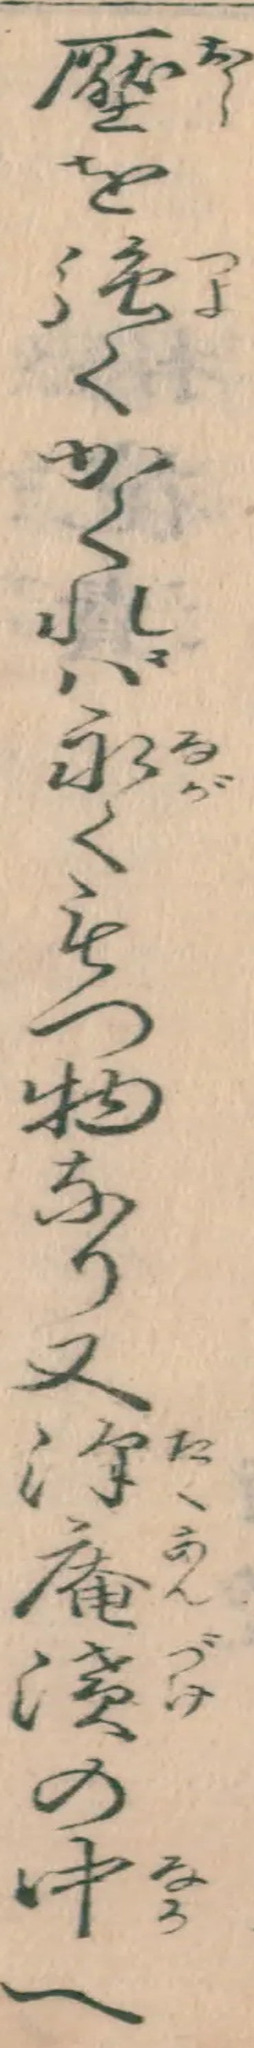圧を強くかくれば永くもつ物なり又沢庵漬の中へ
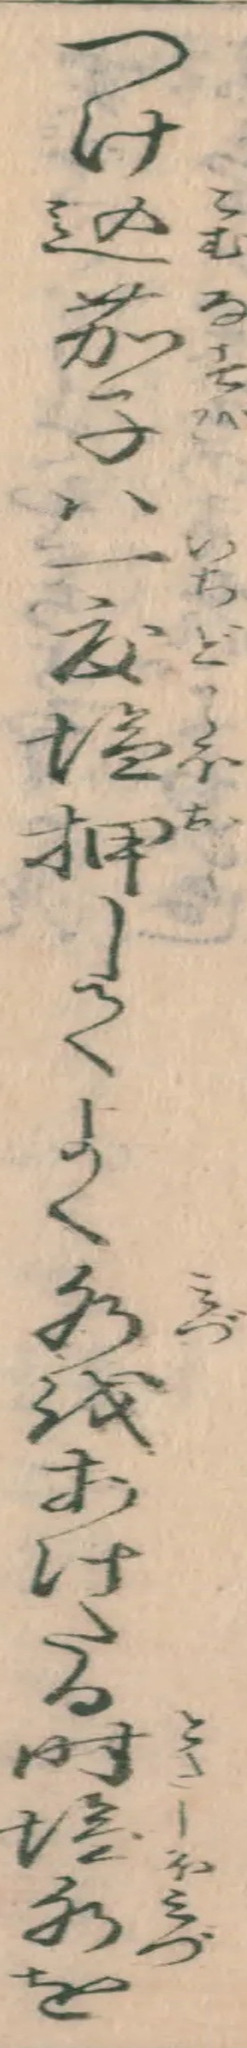つけ込茄子は一度塩押してよく水をあけたる時塩水を
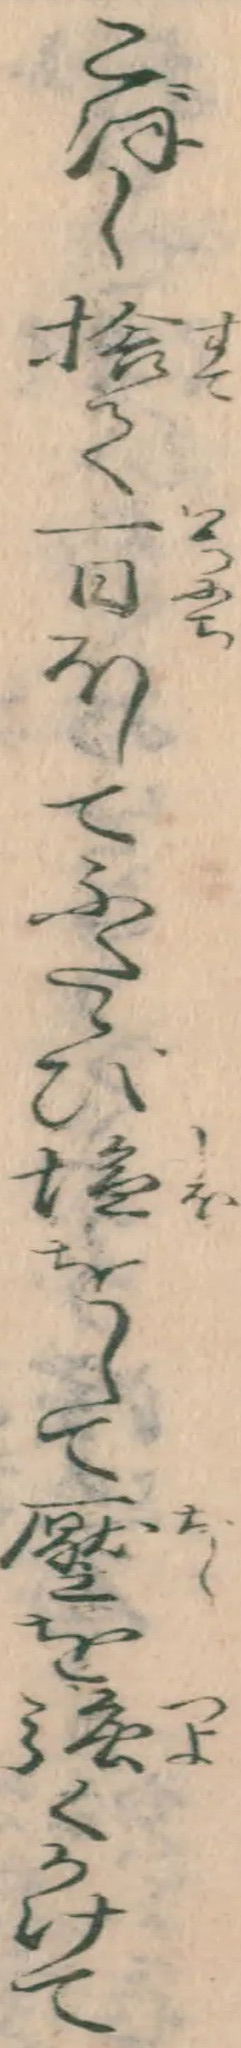こぼし捨て一日ほしてふたゝび塩をして圧を強くかけて
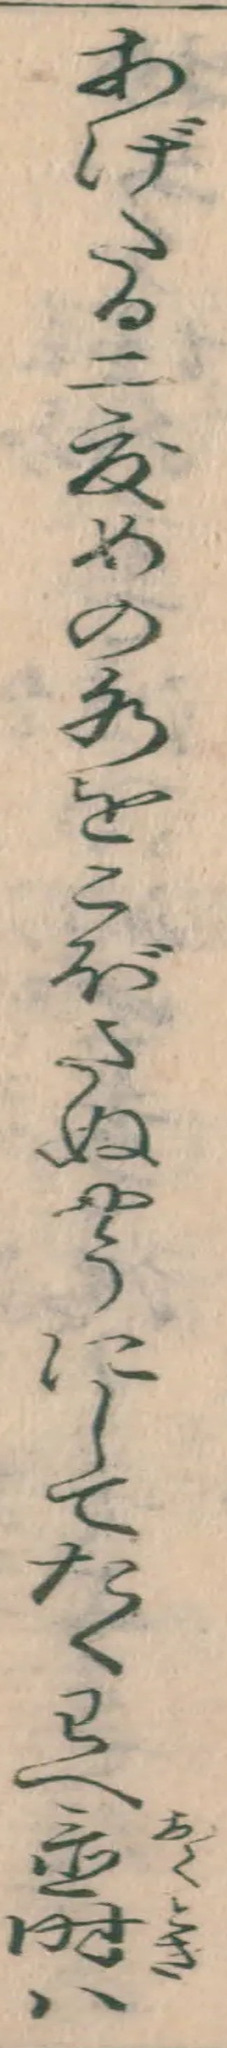あげたる二度めの水をこぼさぬやうにしてたくわへ置時は
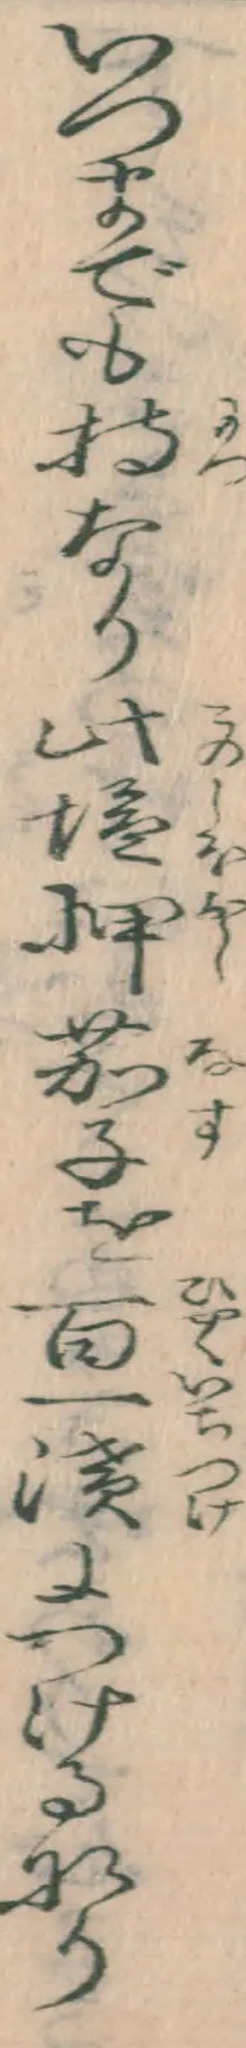いつまでも持なり此塩押茄子を百一漬につけるなり
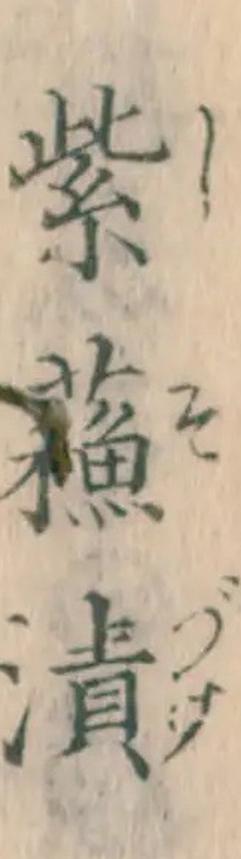紫蘇漬
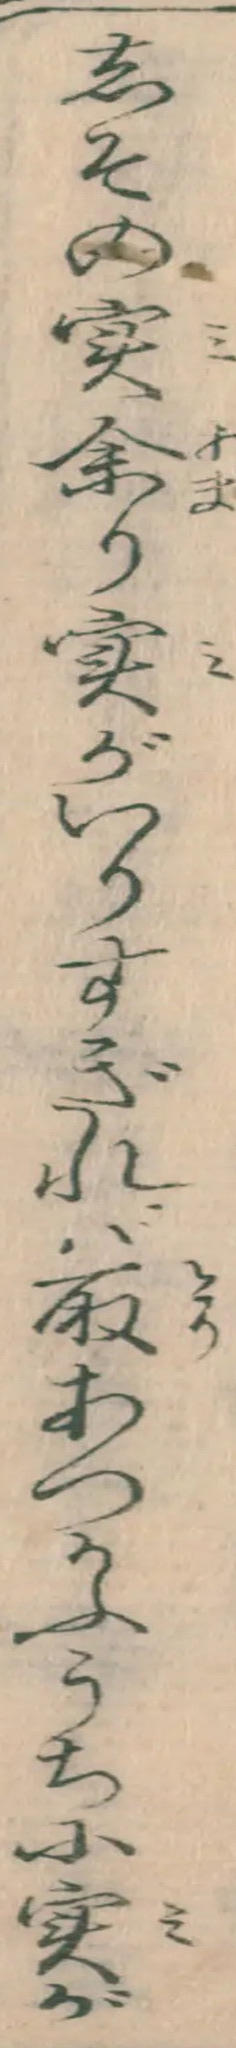しその実余り実がいりすぎれば取あつかふうちに実が

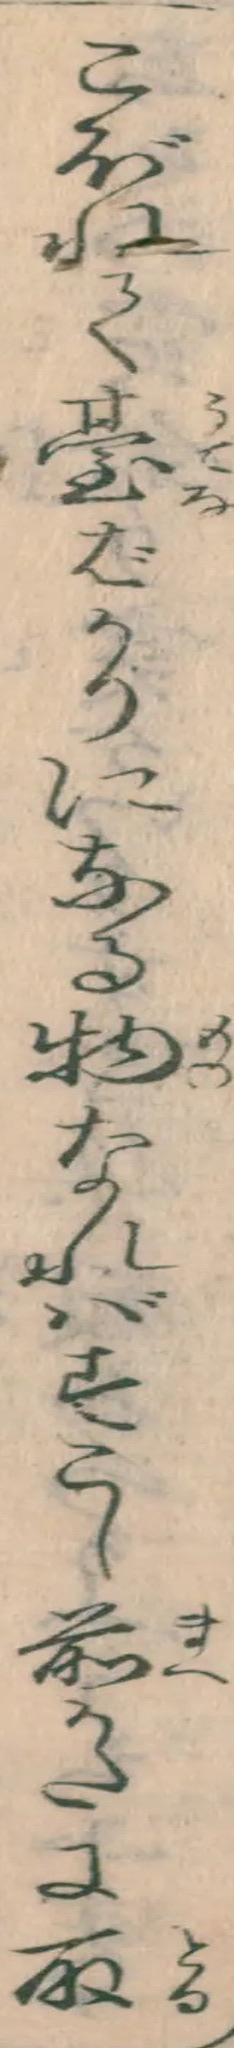こぼれて台ばかりになる物なればすこし前かたに取
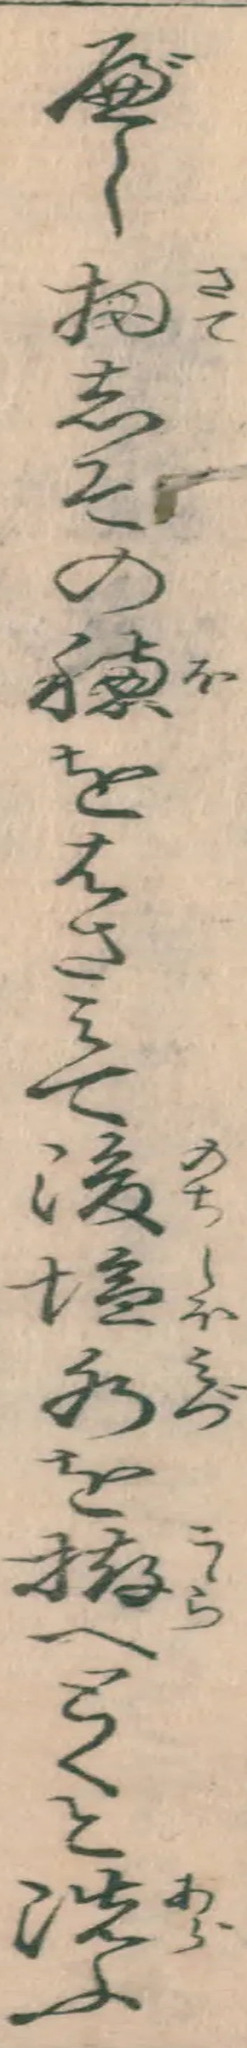べし扨しその穂をはさみて後塩水を拵へとくと洗ふ
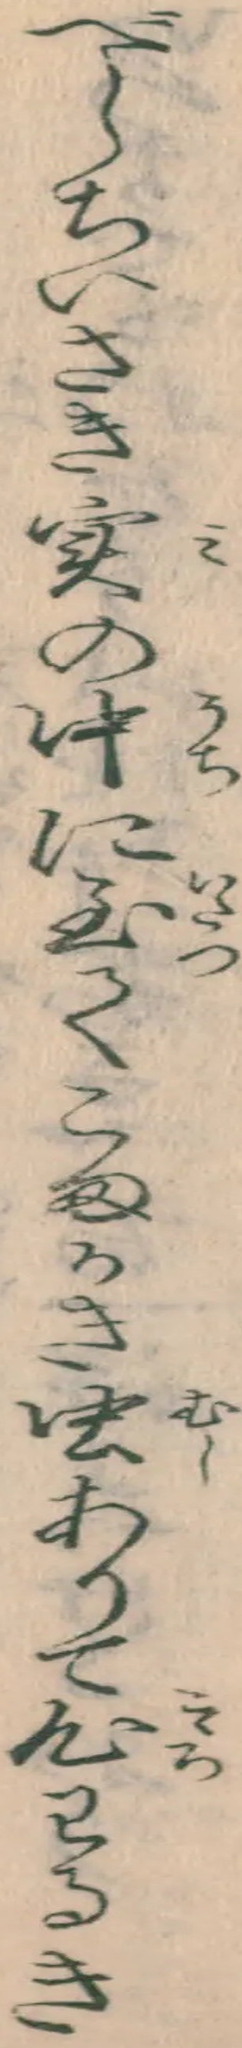べしちいさき実の中に至てこまかき虫ありて心わるき
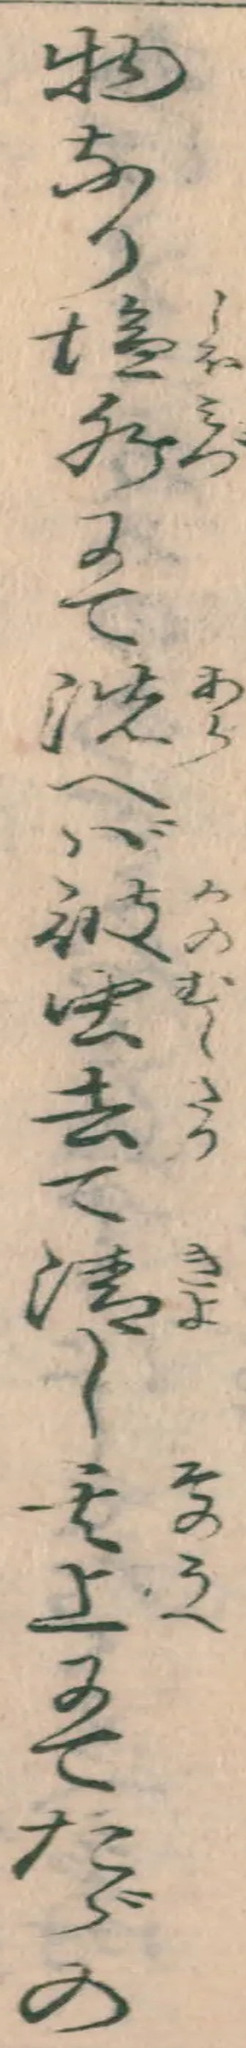物なり塩水にて洗へば彼虫去て清し其上にてたゞの
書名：四季漬物鹽嘉言
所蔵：国立国会図書館 National Diet Library, JAPAN
